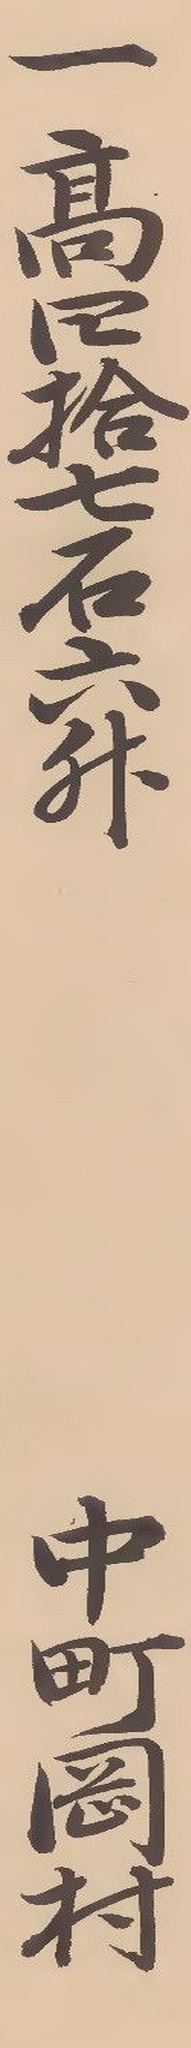一高四拾七石六升中町岡村

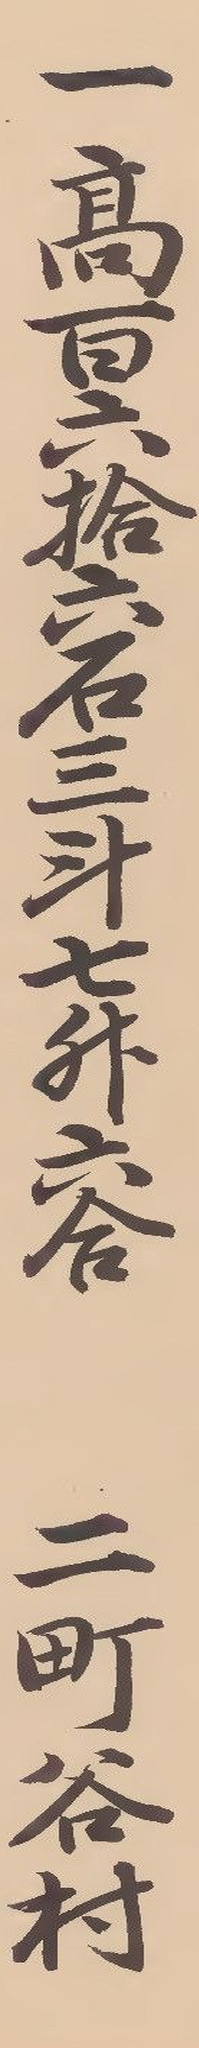一高百六拾六石三斗七升六合二町谷村
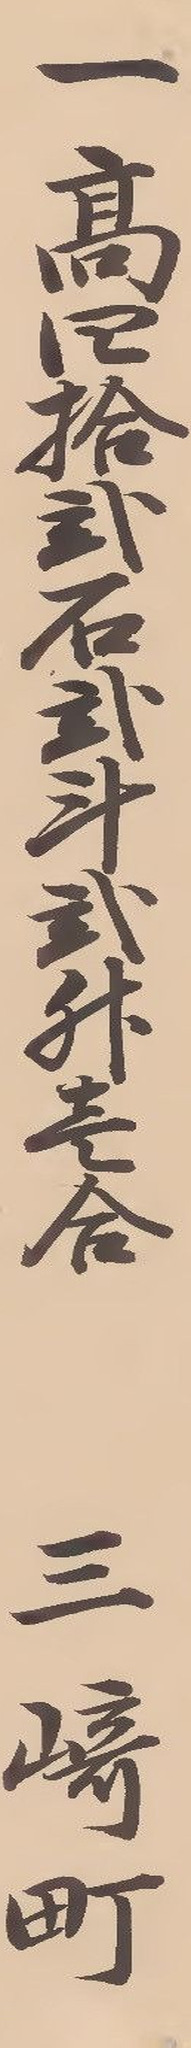一高四拾弐石弐斗弐升壱合三崎町
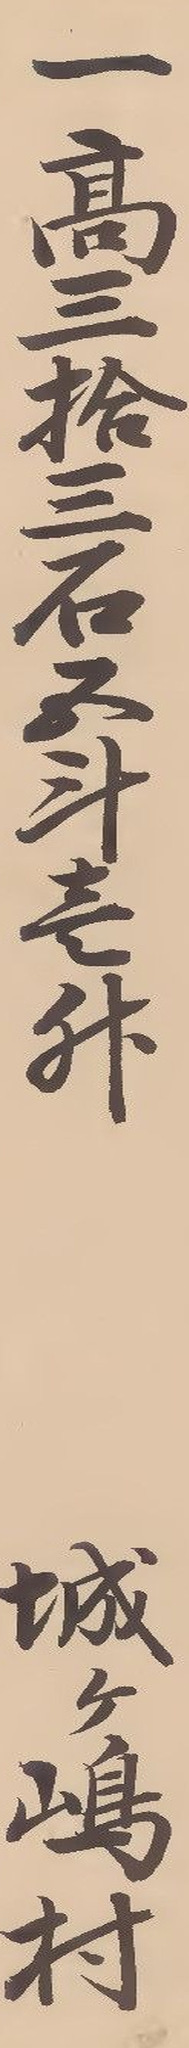一高三拾三石五斗壱升城ヶ嶋村
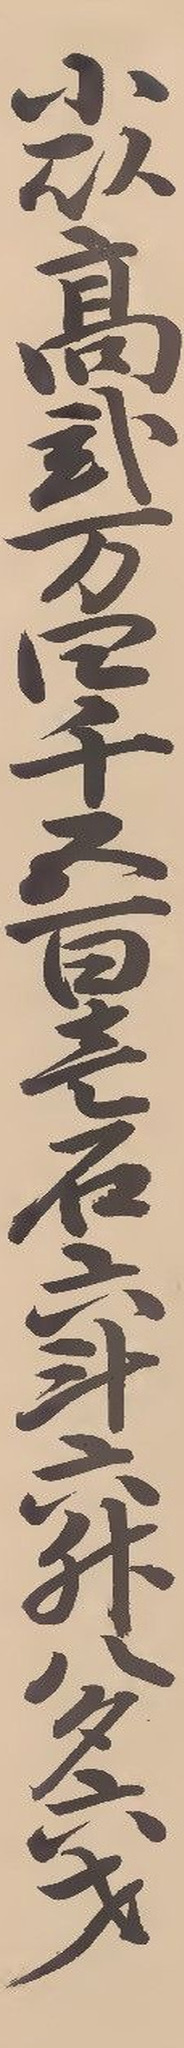小以高弐万四千五百壱石六斗六升八勺六才

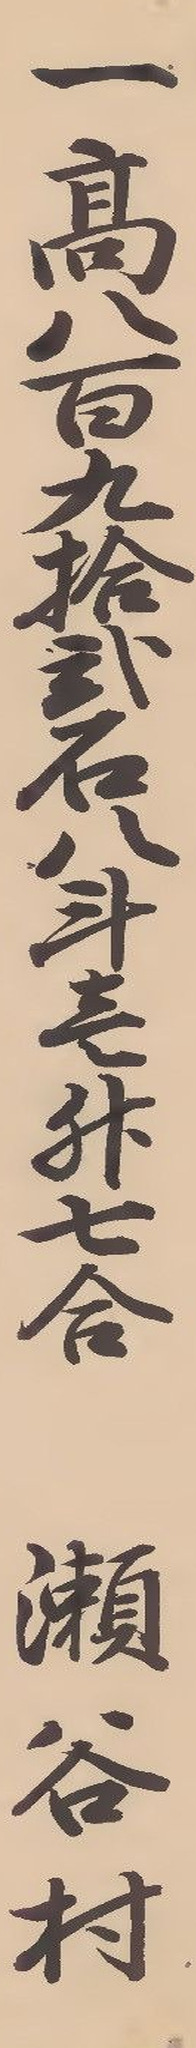一高八百九拾弐石八斗壱升七合瀬谷村
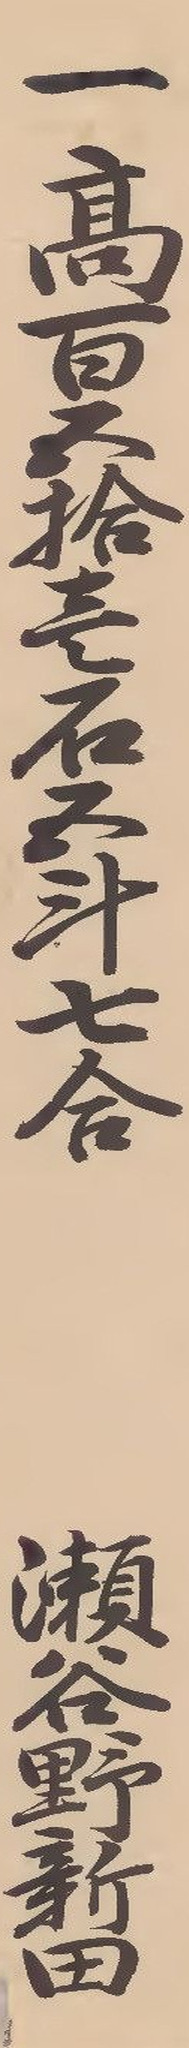一高百五拾壱石五斗七合瀬谷野新田
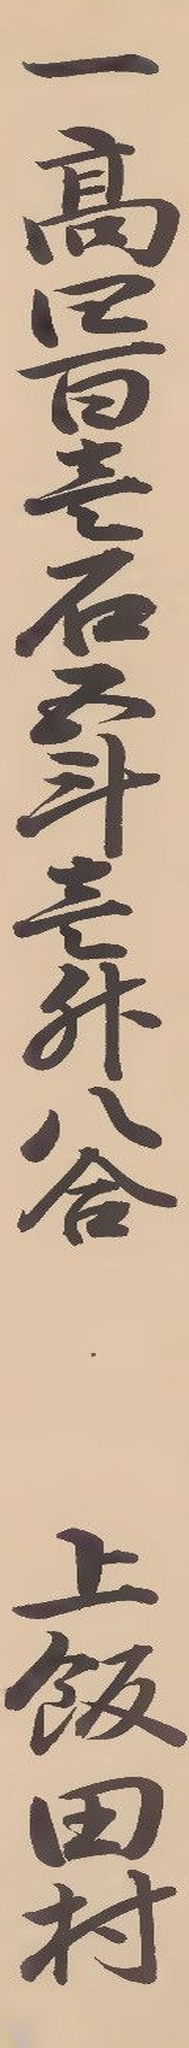一高四百壱石五斗壱升八合上飯田村
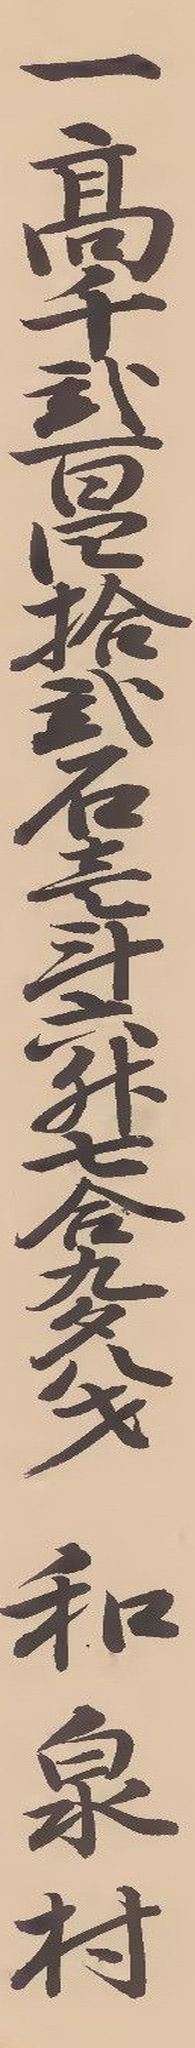一高千弐百四拾弐石壱斗六升七合九勺八才和泉村
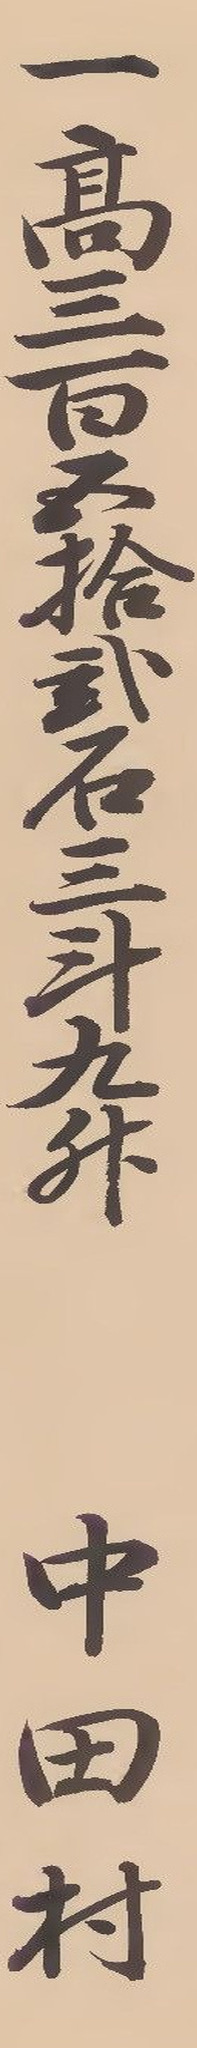一高三百五拾弐石三斗九升中田村

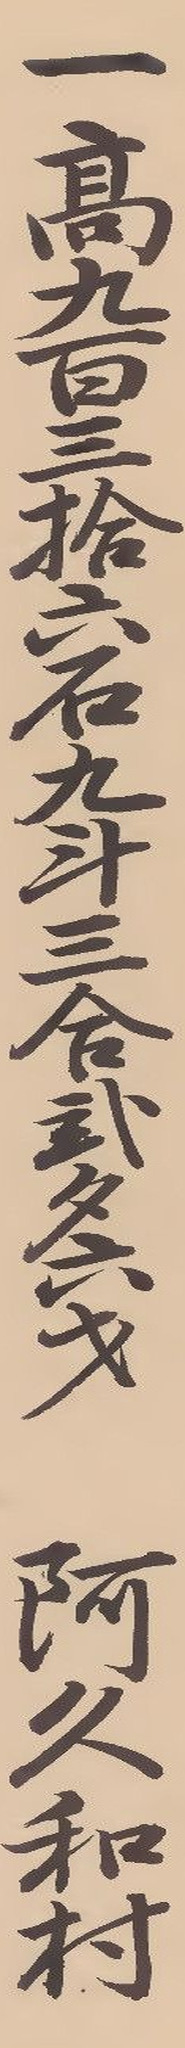一高九百三拾六石九斗三合弐勺六才阿久和村
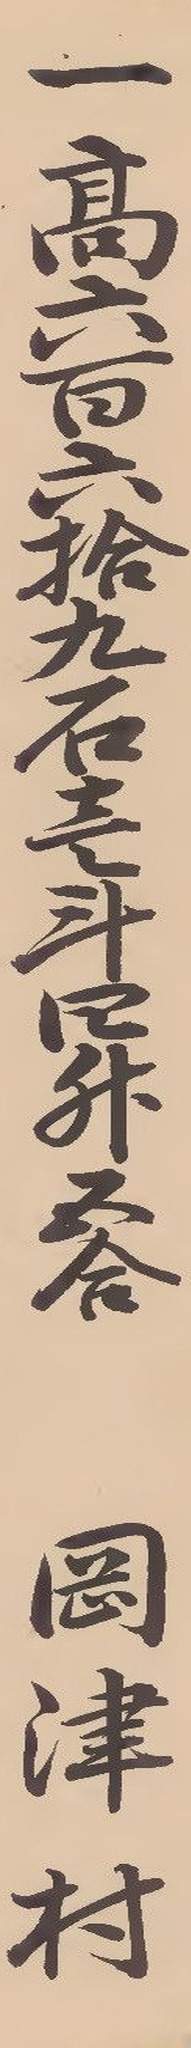一高六百六拾九石壱斗四升五合岡津村
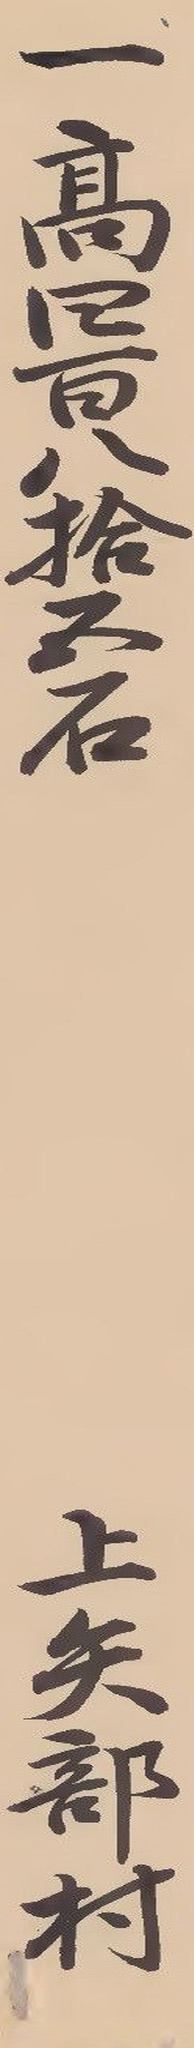一高四百八拾五石上矢部村
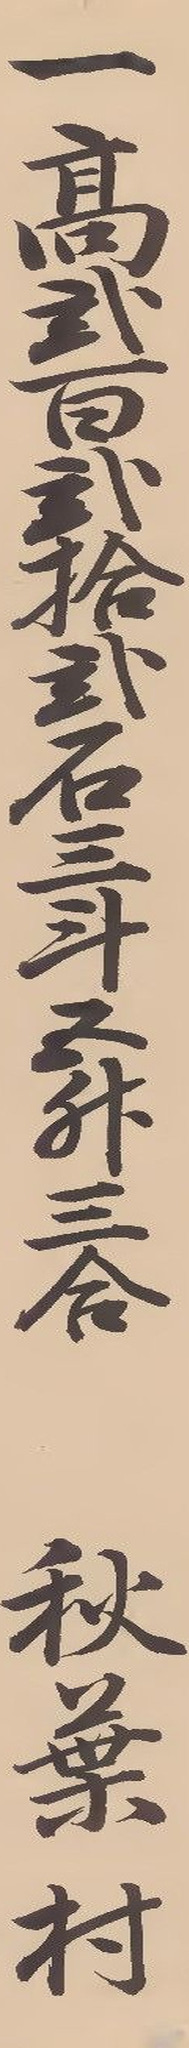一高弐百弐拾弐石三斗五升三合秋葉村
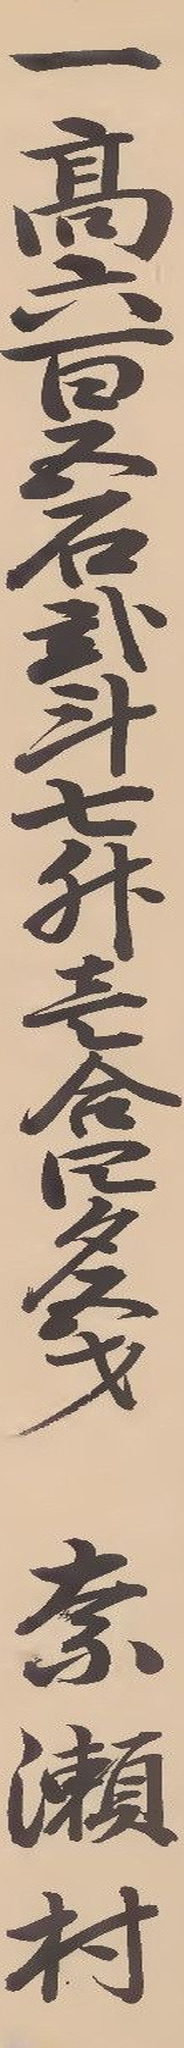一高六百五石弐斗七升壱合四勺五才奈瀬村
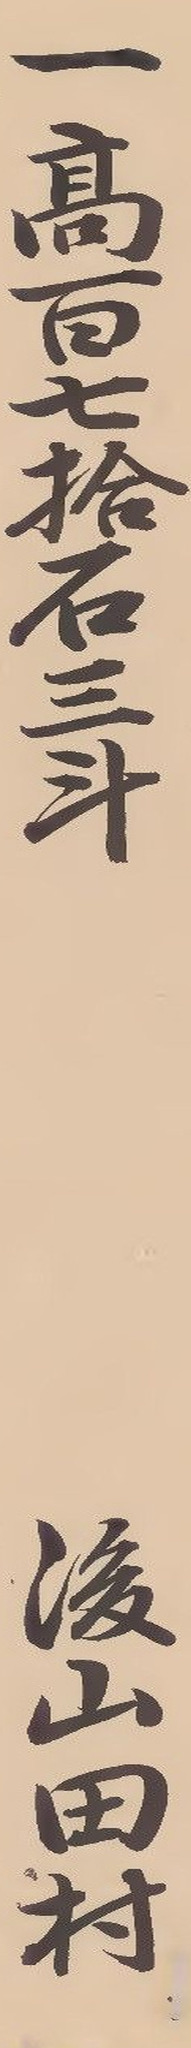一高百七拾石三斗後山田村
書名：相模国郷帳
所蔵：国立公文書館 National Archives of Japan
